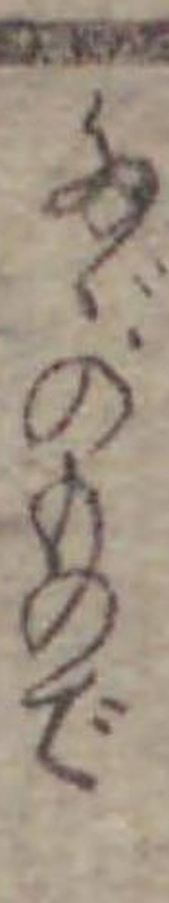たゞのもので
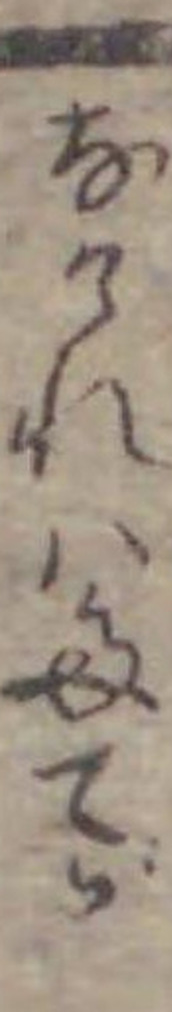なけれはたてが
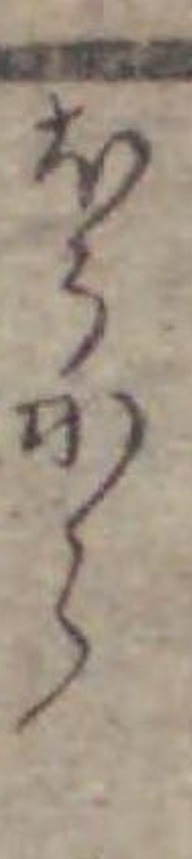ほうから
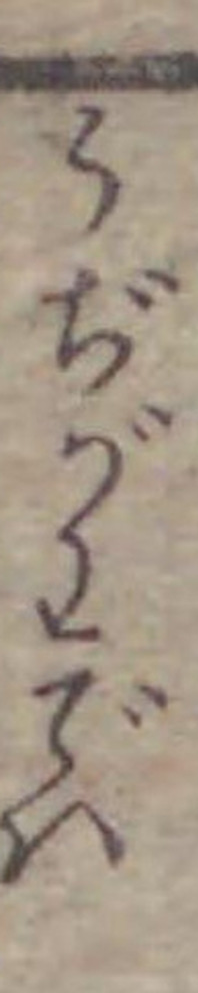うぢがわでは
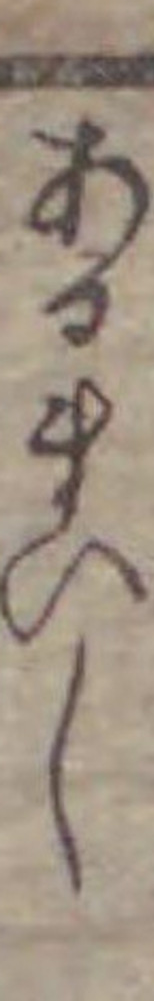あるまいし
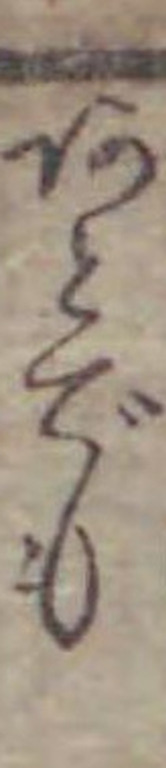あとでも
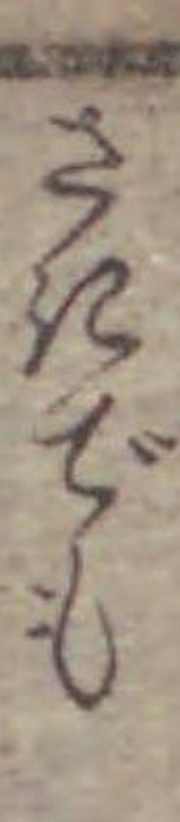さきでも
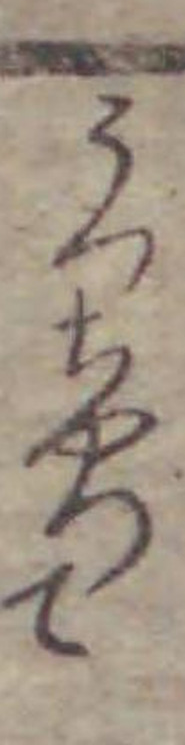うつちやつて
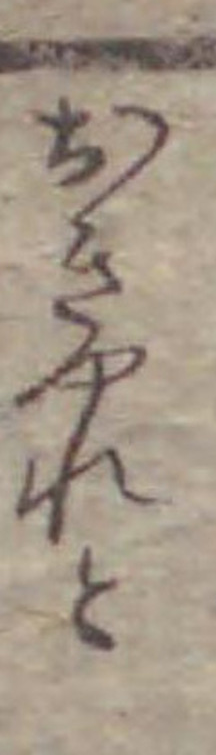おきやれと
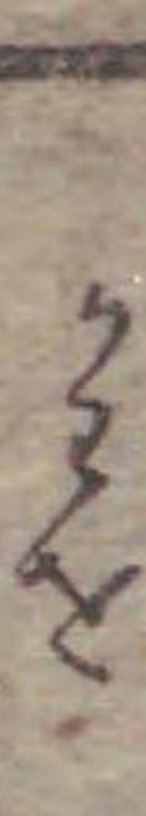かわを

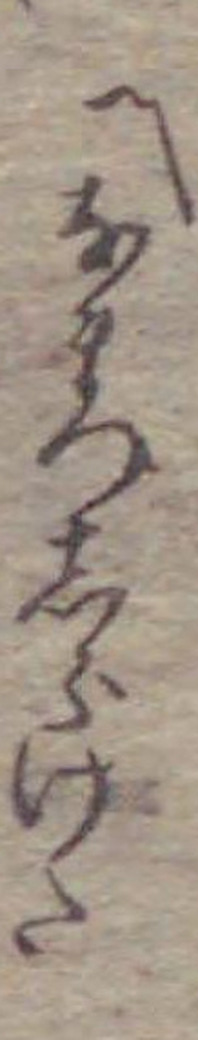〽なまつしらけた
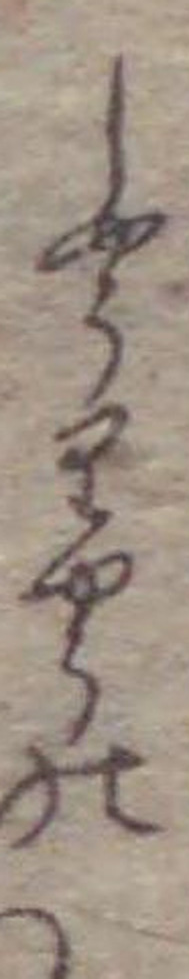しやうりうの
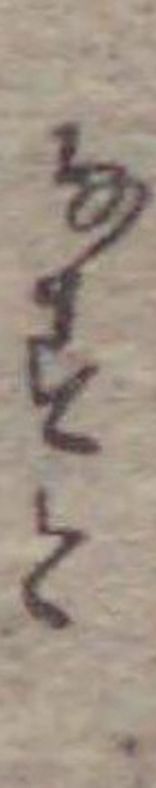なすと
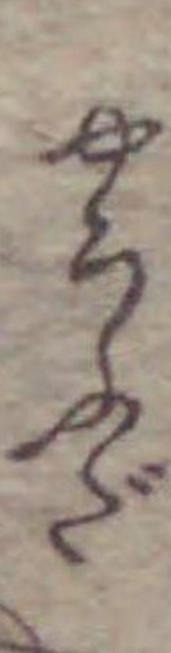やろふだ
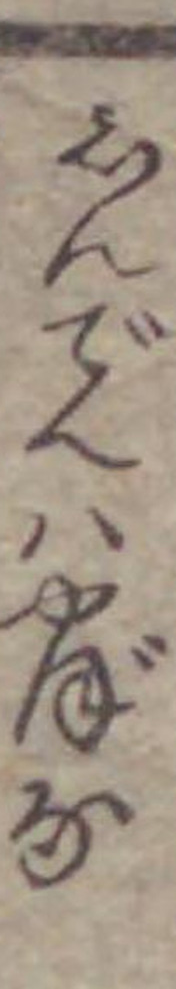しんでんはやぼな
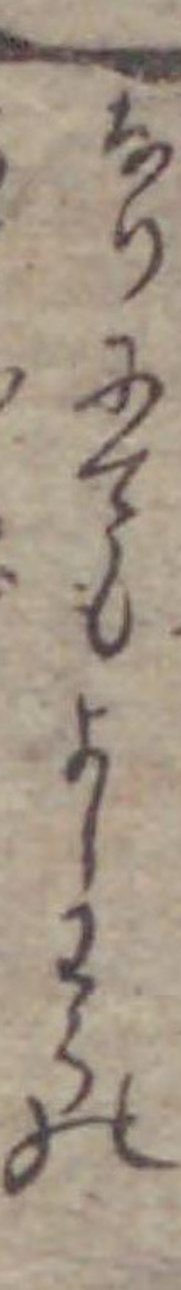なりにてもよしわらの
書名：談芭菰誉詞 : 3巻
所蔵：国立国会図書館 National Diet Library, JAPAN
